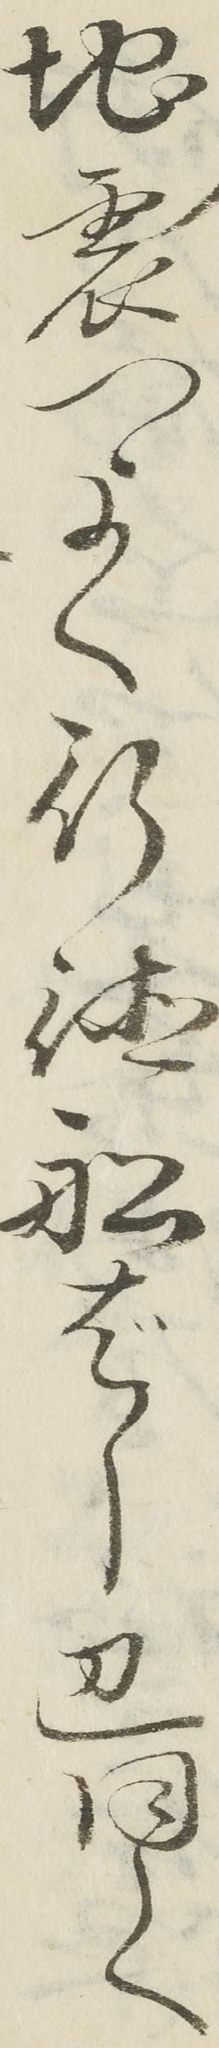地震つよく行徳船ばし辺同しく
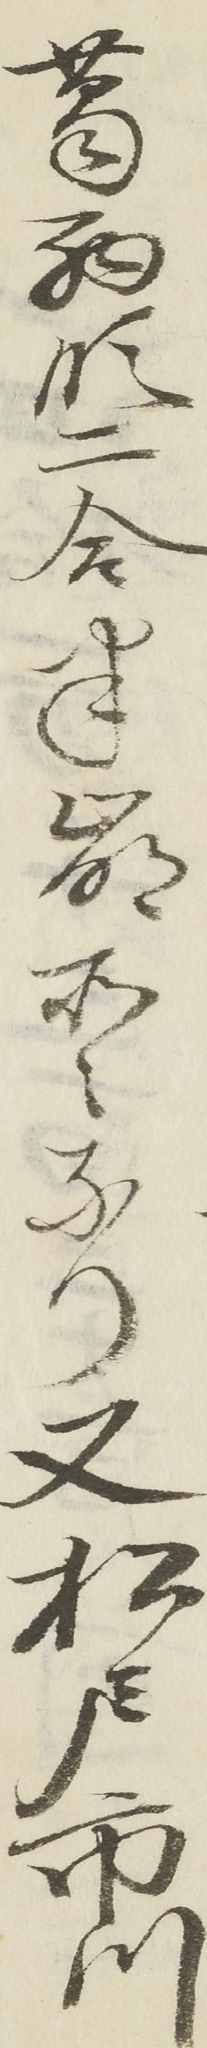葛西領二合半崩所〻なり又松戸市川
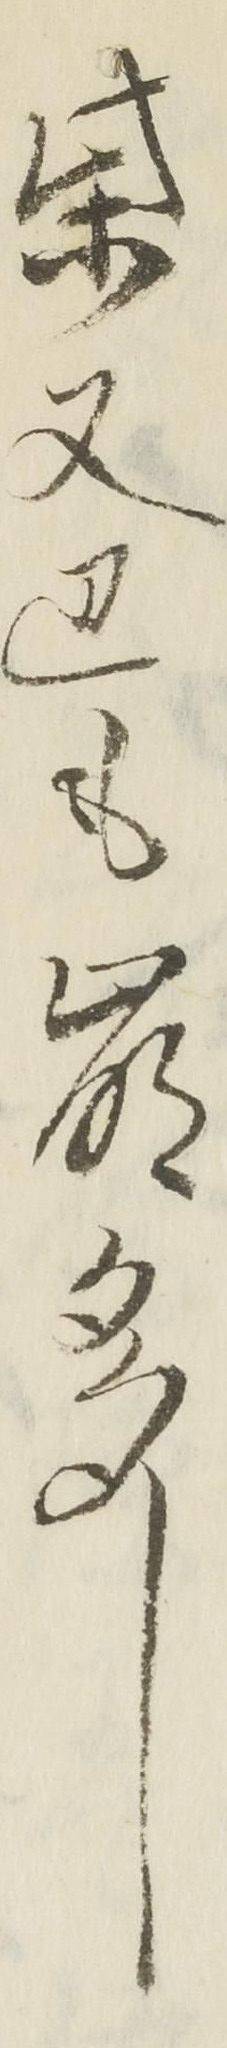柴又辺も崩多し
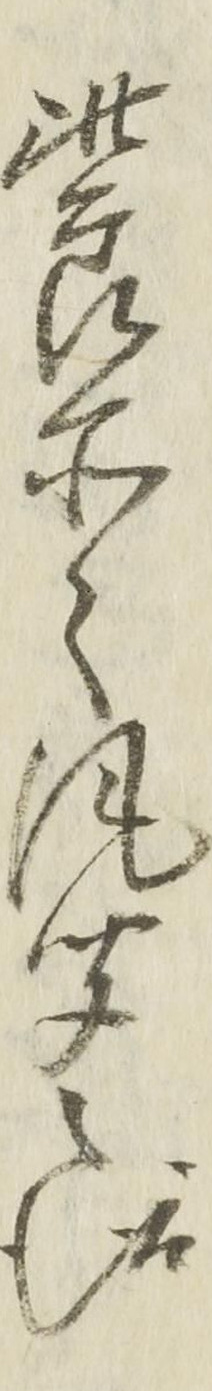此節所〻風聞之趣
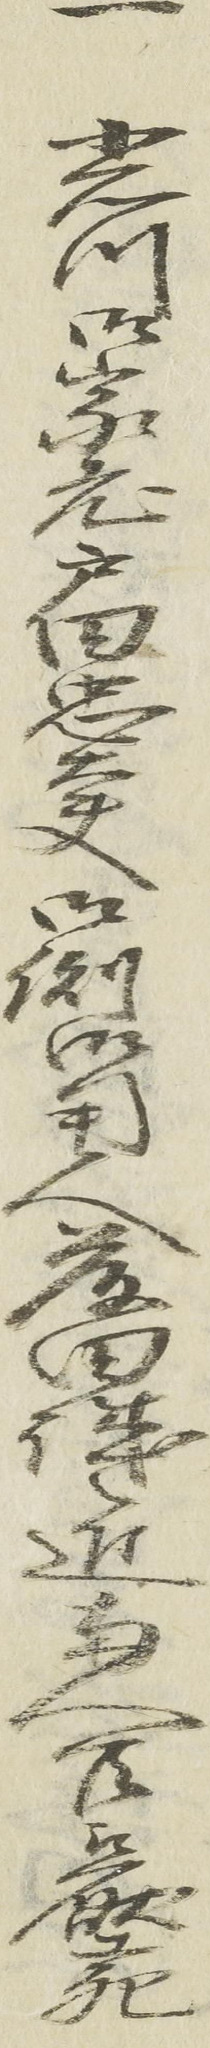一小石川御家老戸田忠大夫御側御用人藤田誠之進両人共被圧死
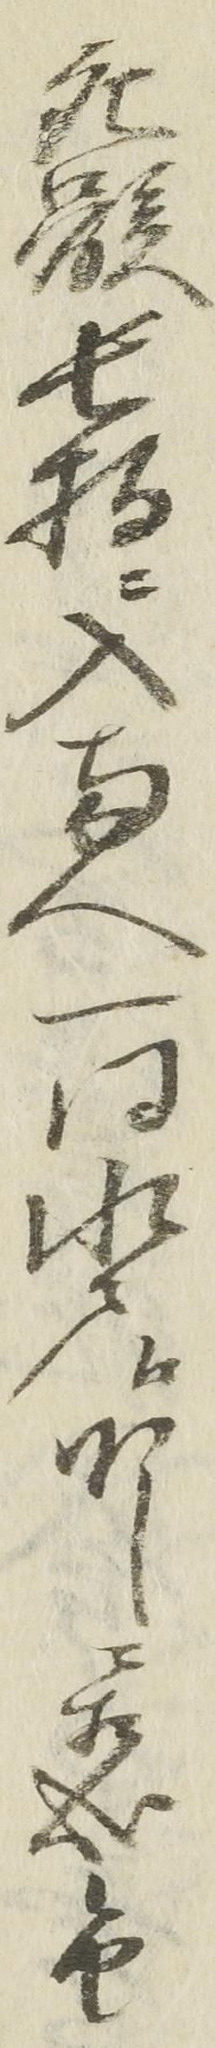死骸長持二入両人一同水戸江帰し二相成候由
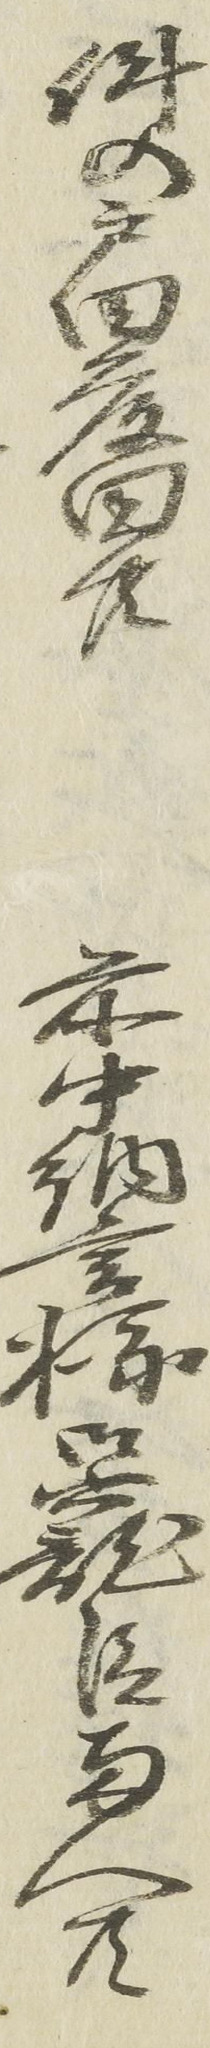件の戸田藤田共前中納言様御寵臣両人共
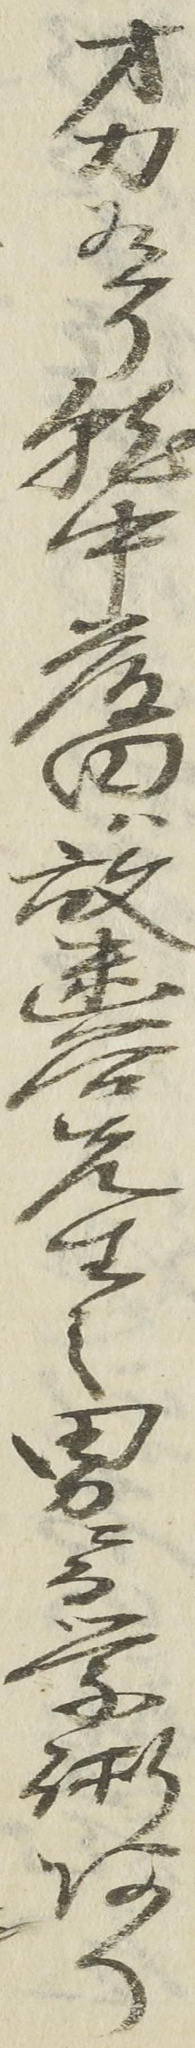才力有り就中藤田ハ故幽谷先生之男ニ而学術あり
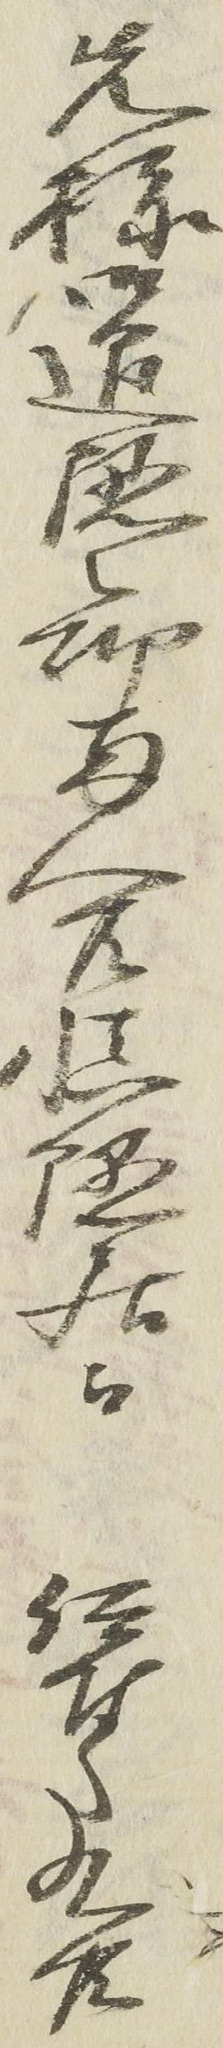先様御遁隠之砌両人共慎随居被仰付たれ共
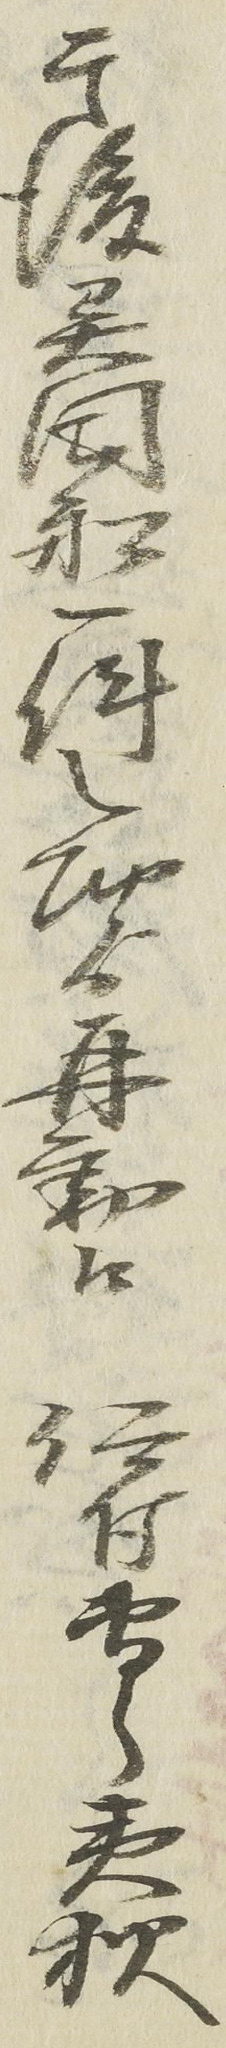其後異国船一件之砌ゟ再動被仰付専ら夷狄
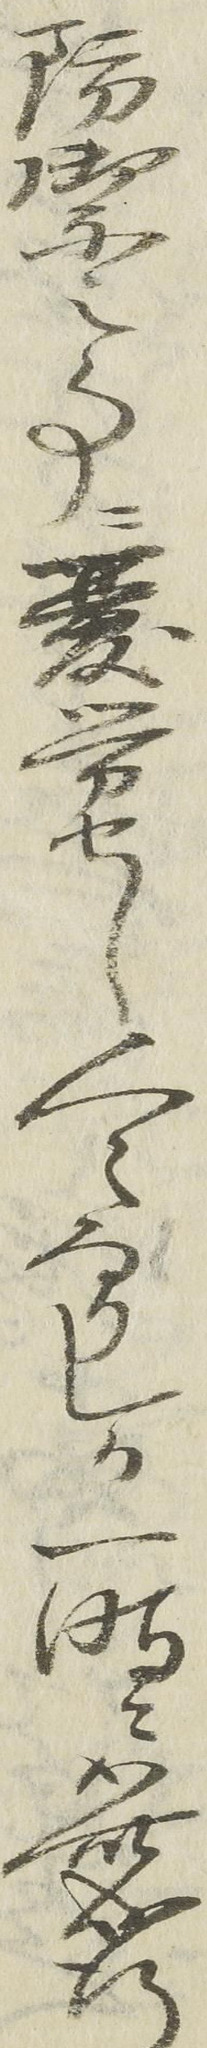防禦之事ニ憂労セし人〻なりしか一時ニ如何成行
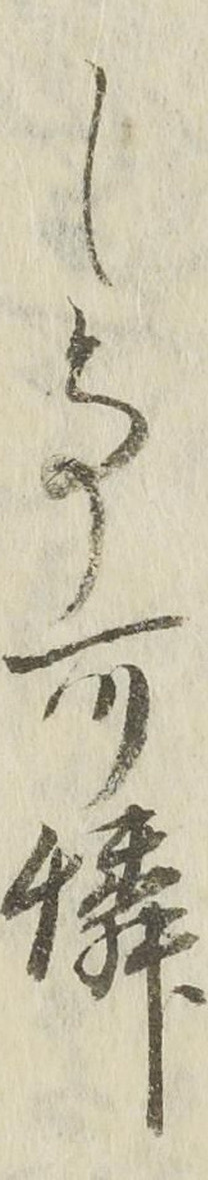し事可憐
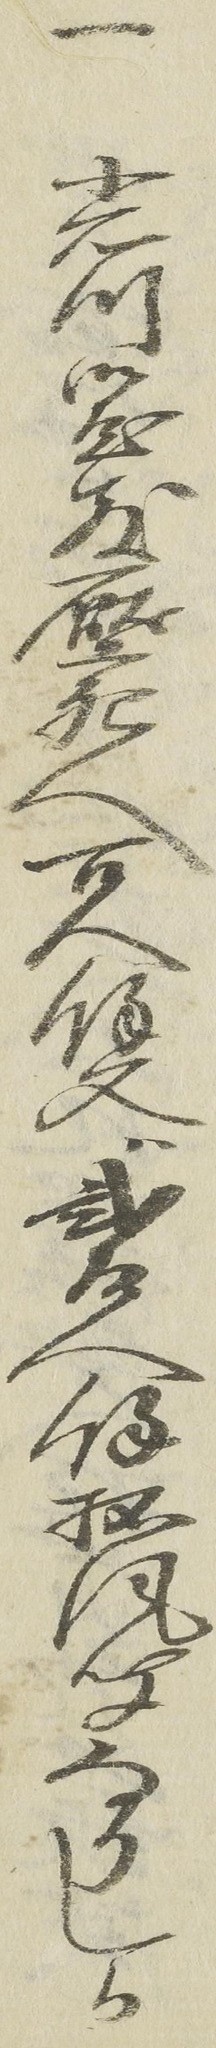一小石川御屋敷圧死人百人餘又ハ弐百人抔風聞なりしか

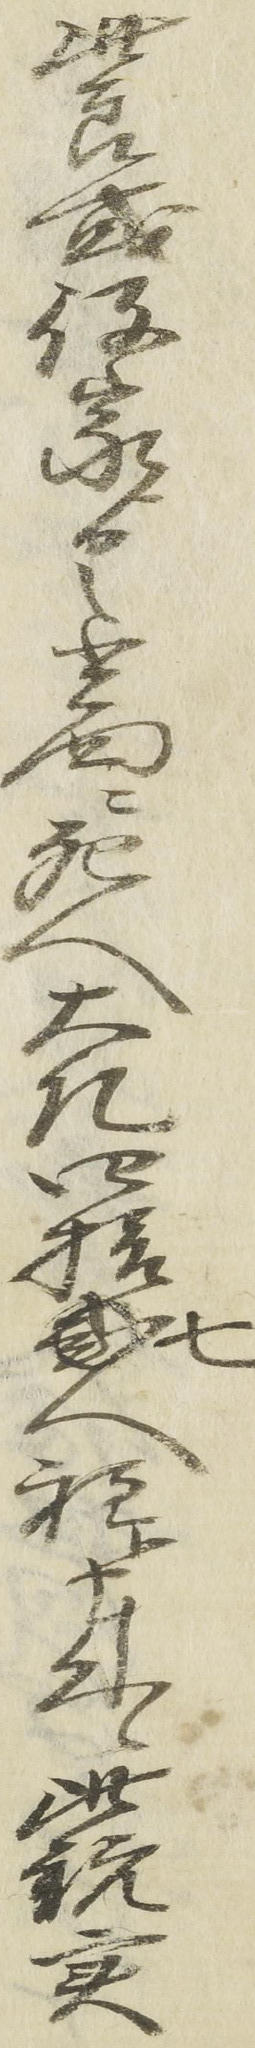此節或役家ゟ之書面ニ死人大凡四拾七人程ト申来候此説実
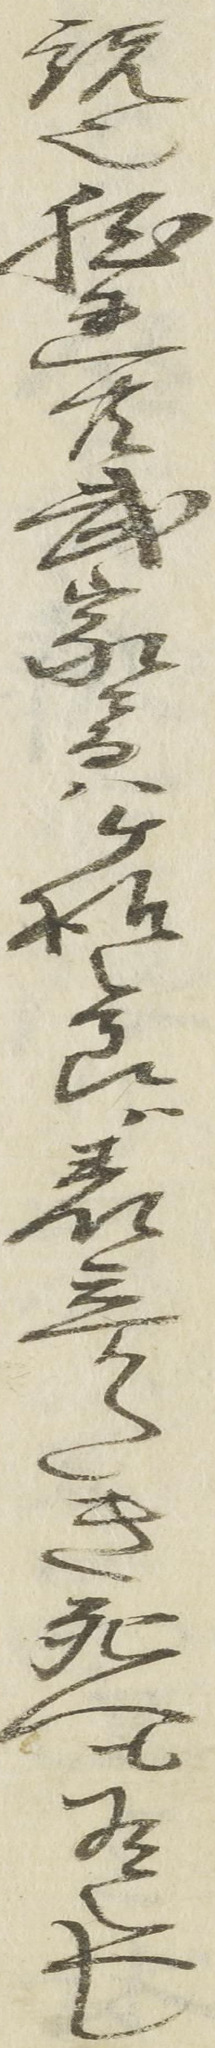説也然れ共武家ニ而ハケ様之節ハ表立かたき死人も有之へし
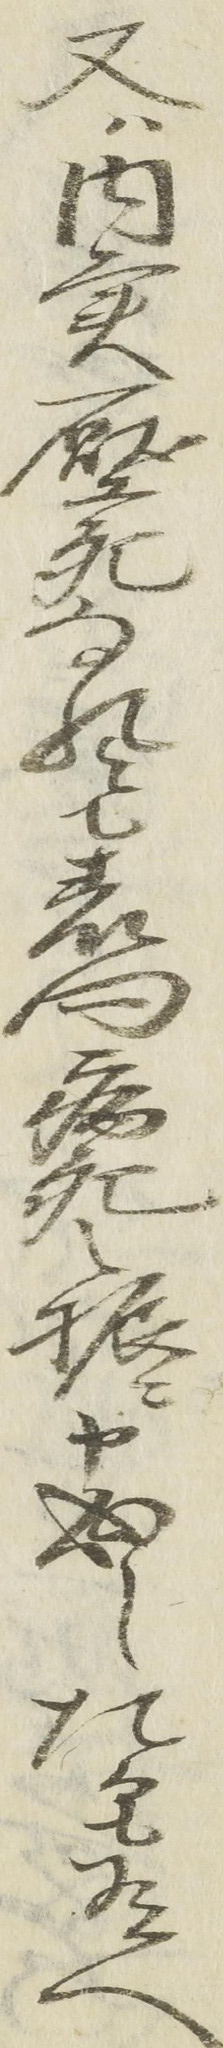又ハ内実圧死なれとも表向病死之振ニ申成したるも有へ
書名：安政乙卯江戸大地震筆記　安政丙辰八月大阪大雷雨之記追加　安政三辰年七月松前辺大地震并八月大風雨記録
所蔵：東京大学地震研究所図書室 Earthquake Research Institute Library, The University of Tokyo, JAPAN
